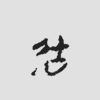居
